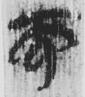而
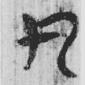卜
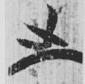之
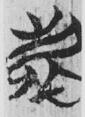○（表）
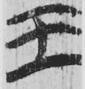王
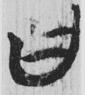曰
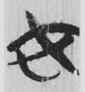女（如）
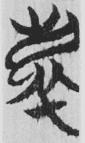○（表）
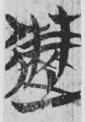速
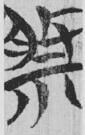祭
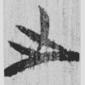之
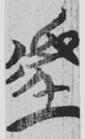○（吾）
